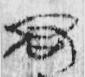君
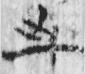之
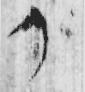人
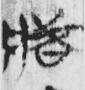戕
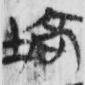塙
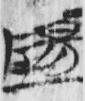○（陽）
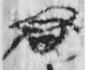君
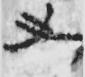之
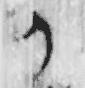人
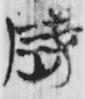○（隋）
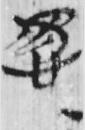惕
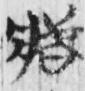戕
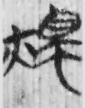燭
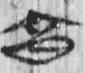亯
